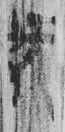癸（揆）
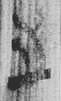之
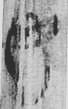母（毋）
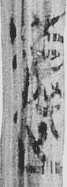遠
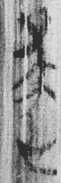○（求）
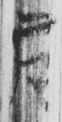厇
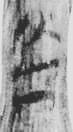於
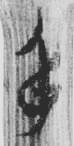身
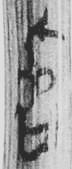旨（稽）
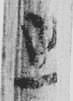之
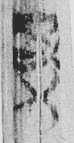𠭁（得）
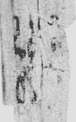{鼠一}（一）
